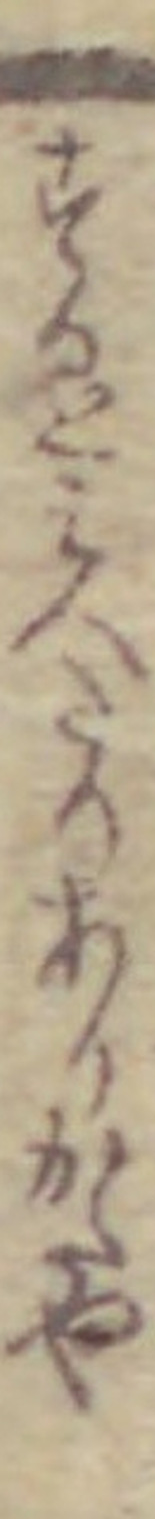するとみへたりありかたや
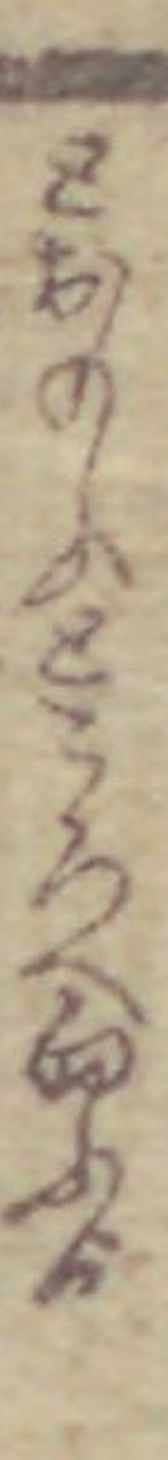とおもふところへ向ふより
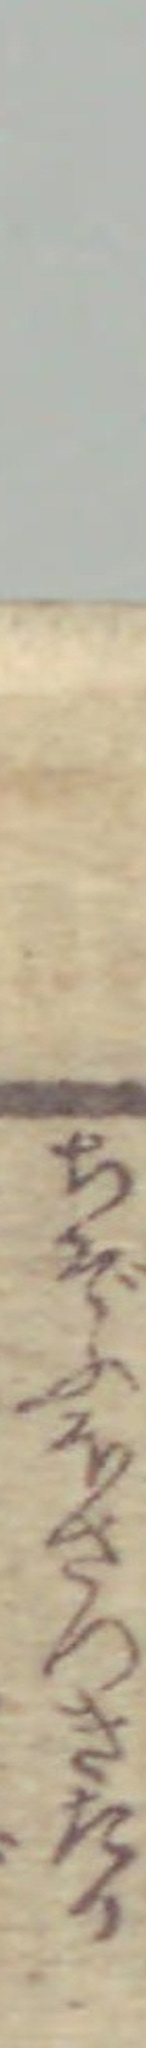ちぞふほさつきたり
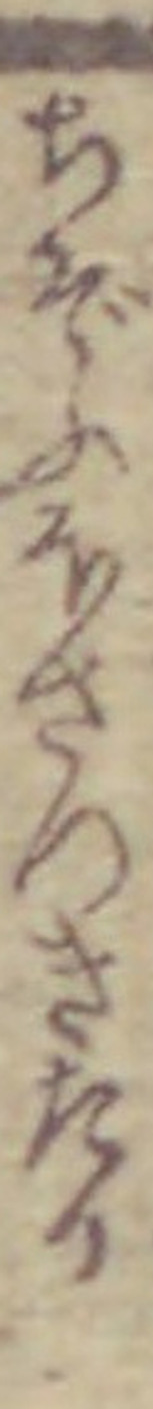ちぞふほさつきたり
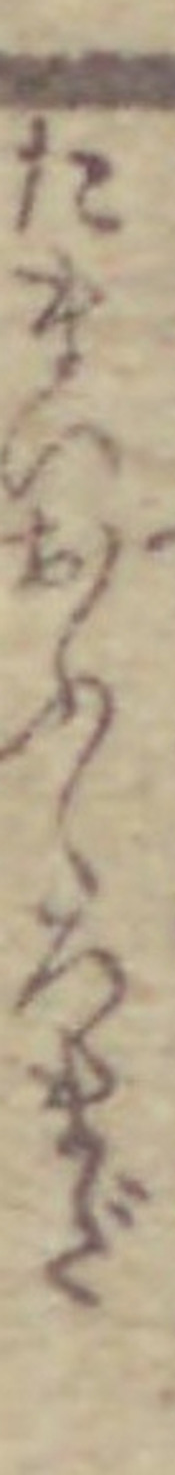たまいおふくろまだ
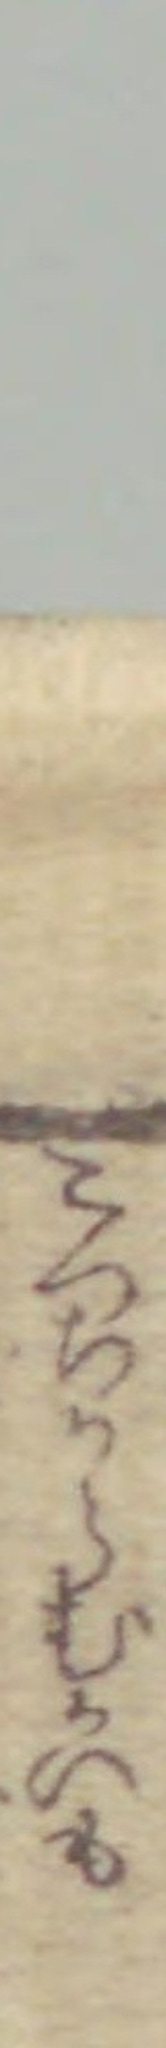こつちからむかいも
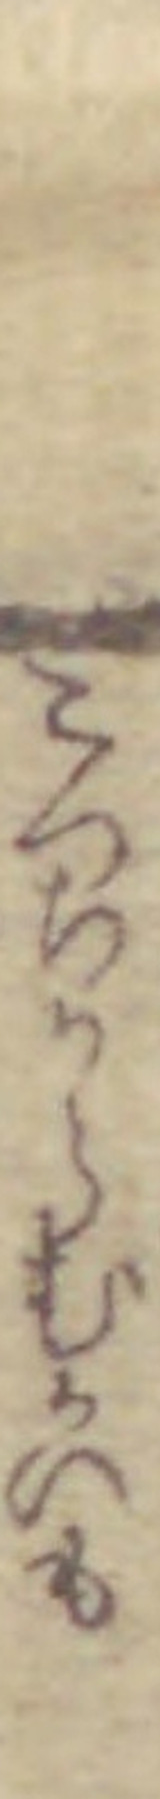こつちからむかいも
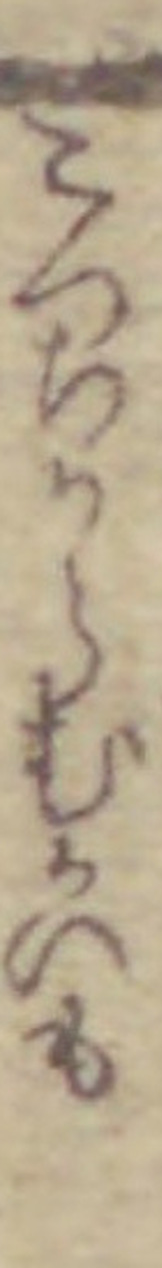こつちからむかいも
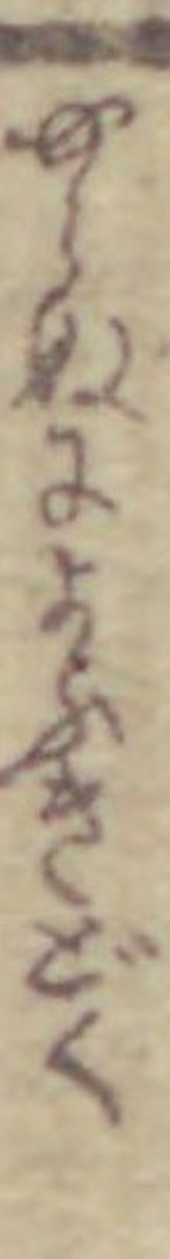やらぬによふきどく
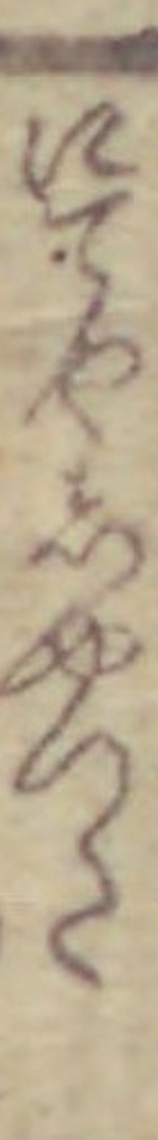にてやしやつた
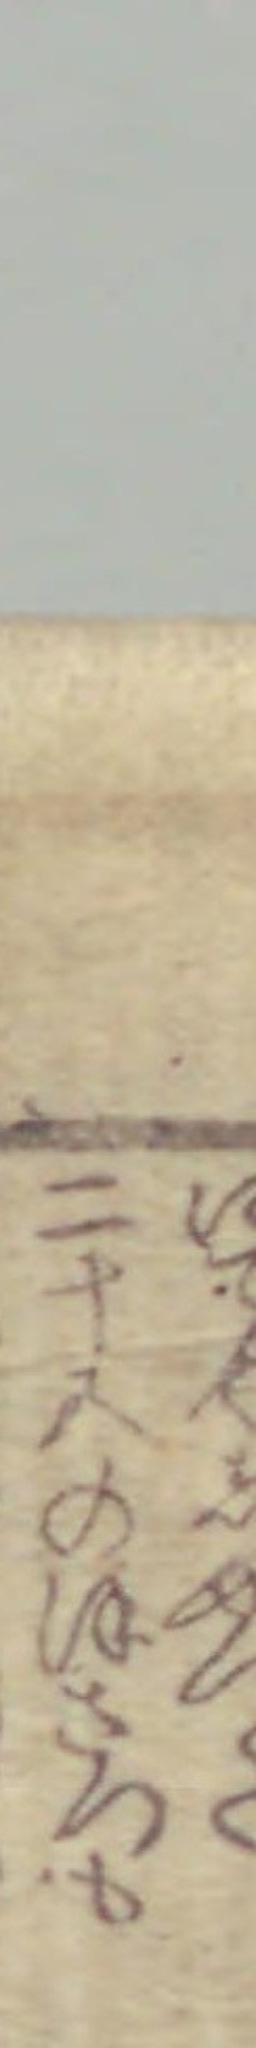二十人のほさつも
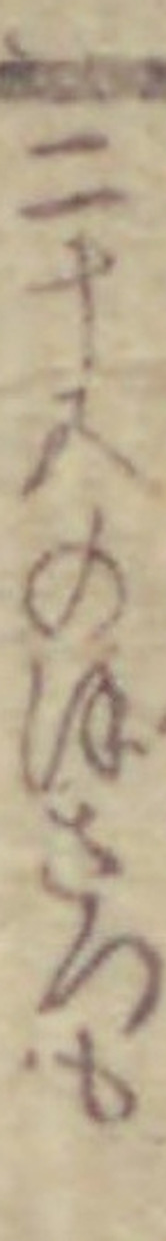二十人のほさつも
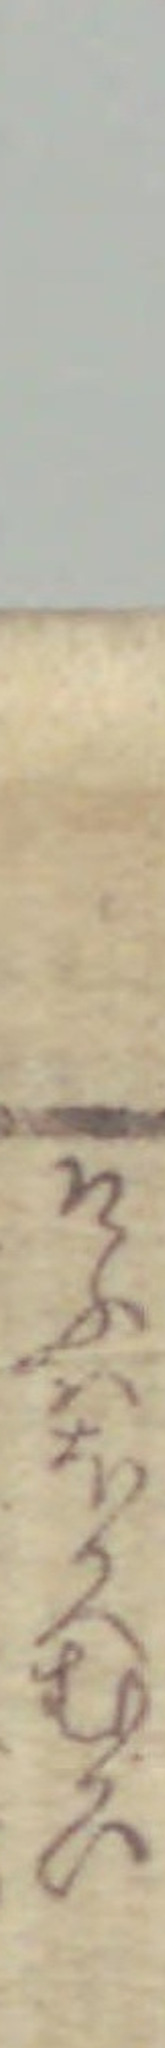けふはほかへむかい
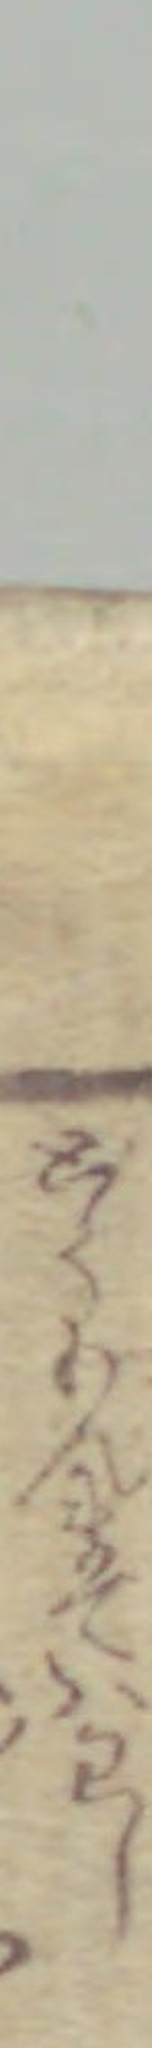とうもんまてはわし
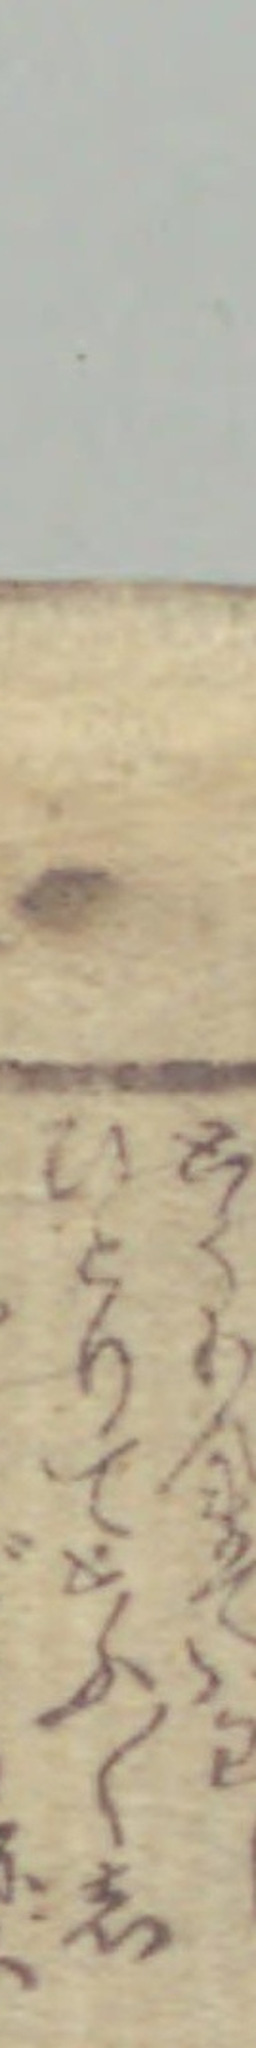ひとりてとふ〳〵し
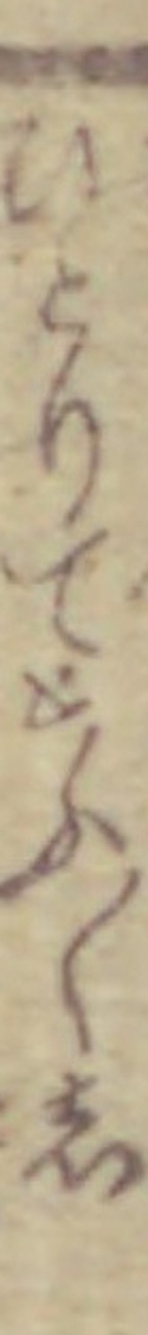ひとりてとふ〳〵し
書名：思事夢濃枕 3巻
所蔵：国立国会図書館 National Diet Library, JAPAN
